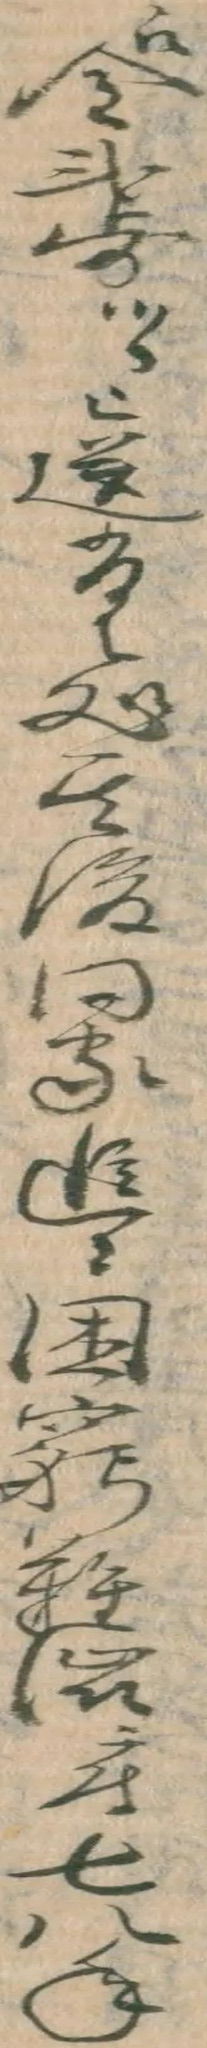え金弐歩ツヽ被送有之処其後同家追々困窮難渋ニ付七八年
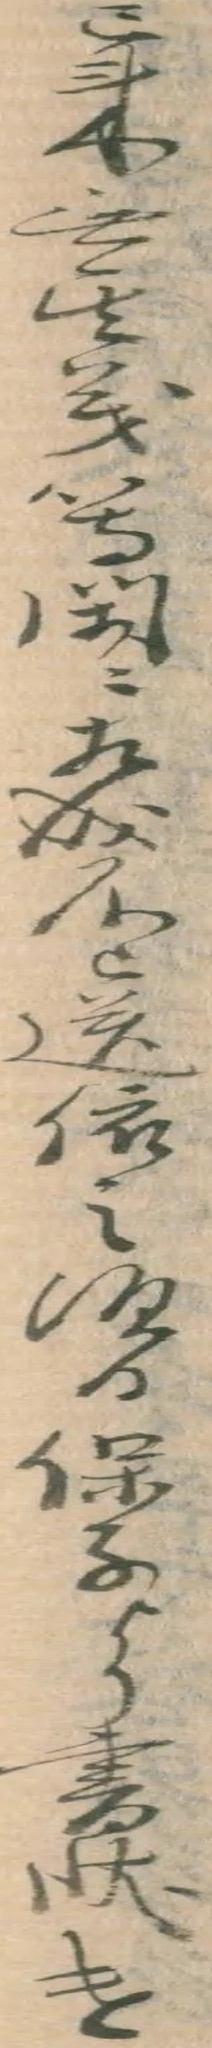已来無其義等閑ニ相成故被送依之次日保子より書状遣
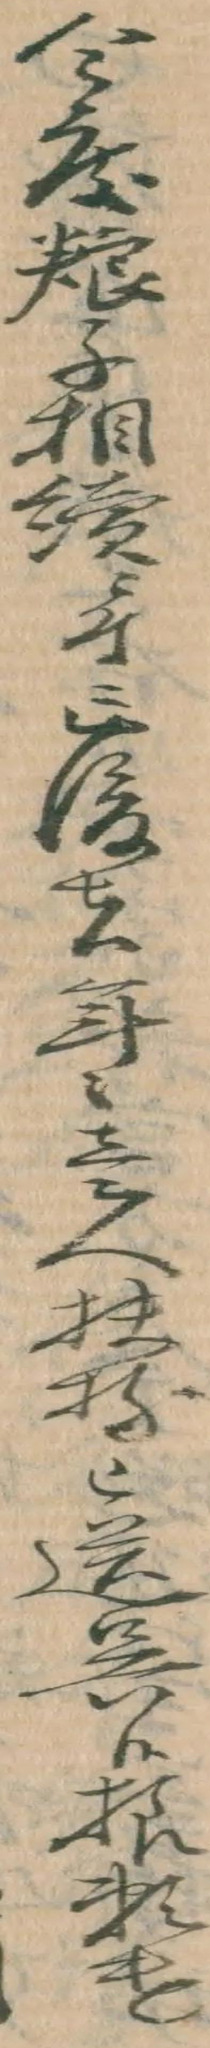今度養子相続ニ付已後者年々壱人扶持被送呉候様頼遣
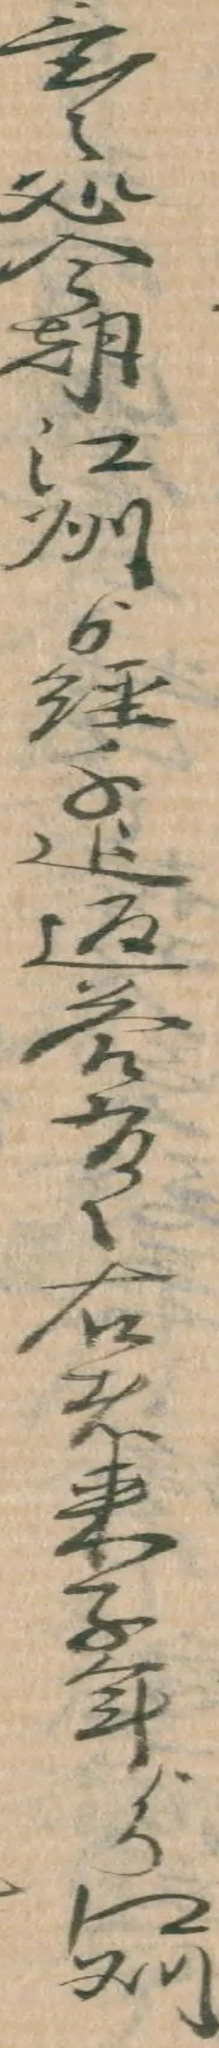置候処今朝江州ゟ経子迄返答有之右者来子年より江州へ
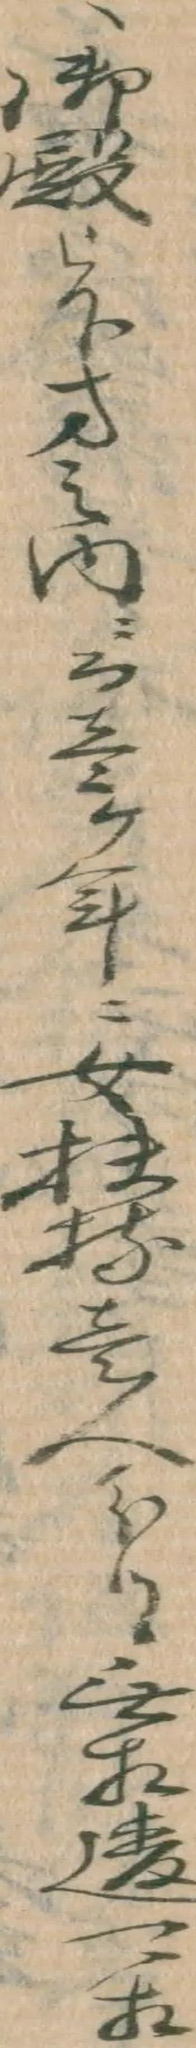へ御殿被下方之内にて壱ヶ年に女扶持壱人分ツヽ無相違可相
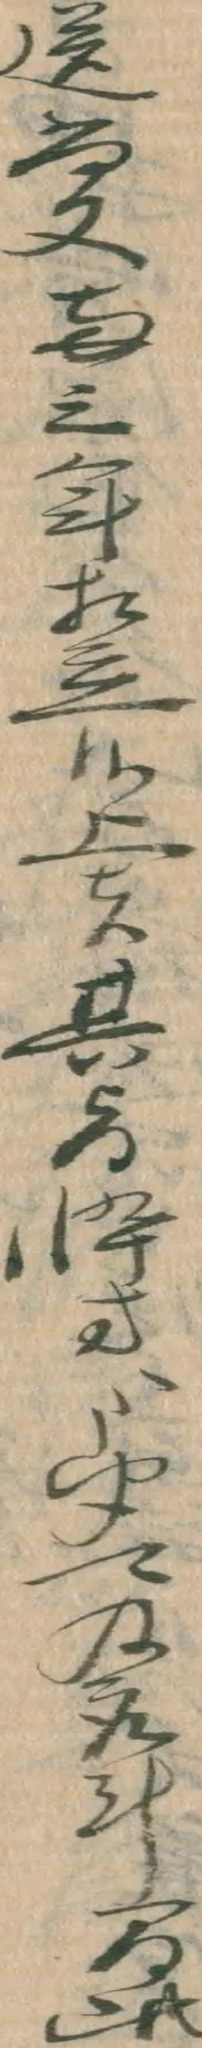送尚又両三年相立候上物其旨忰方へ申聞可申及取計間此
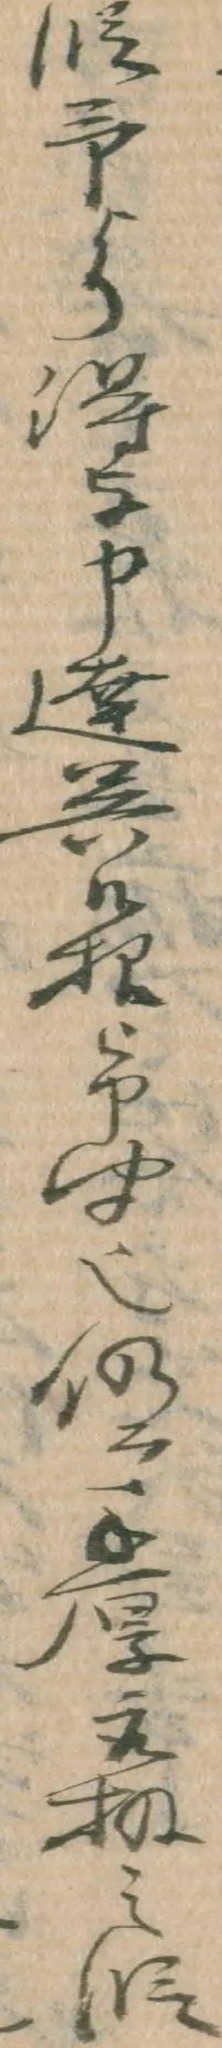段予より得と申達呉候様被申聞也仍而手厚取扱之段
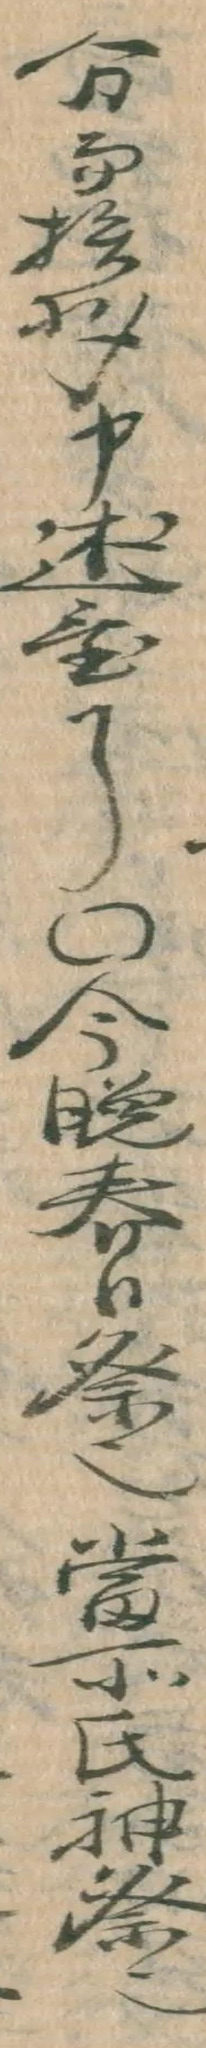分而挨拶申述置了○今晩春日祭也當所氏神祭也
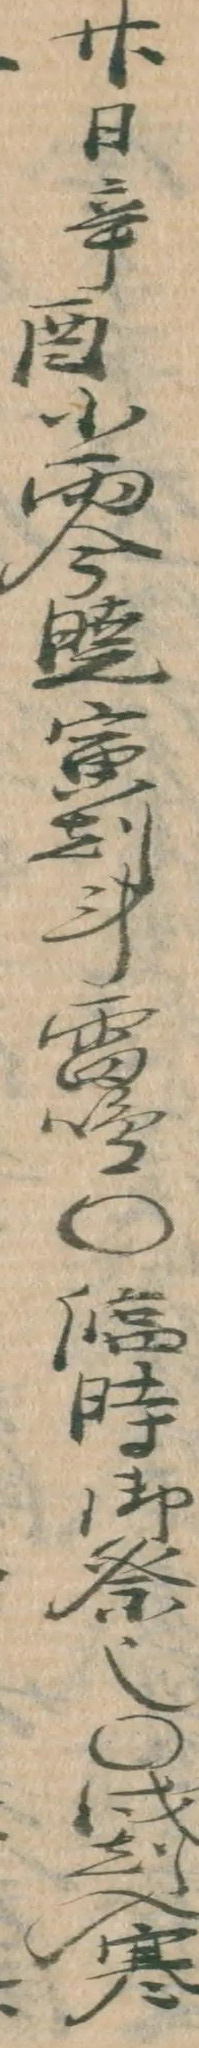廿日辛酉小雨今暁寅刻斗雷鳴○臨時御祭也○戌刻入寒
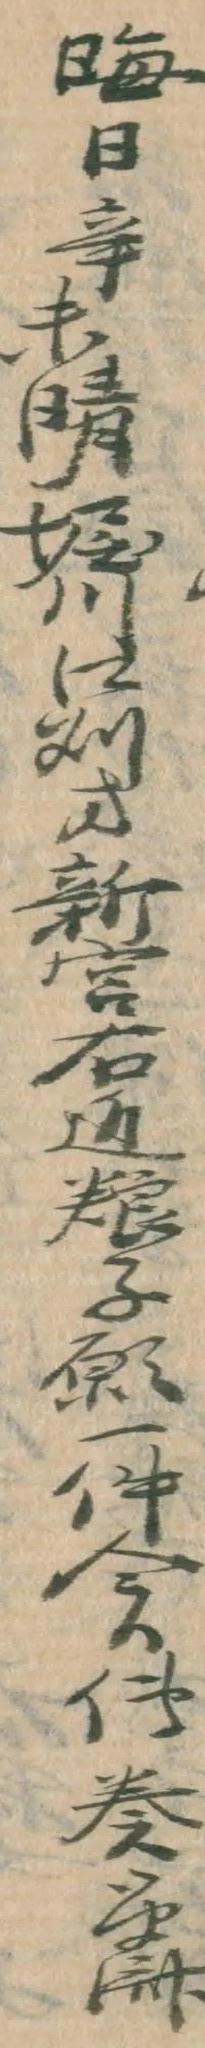晦日辛未晴堀川江州方新宮右近養子願一件今日傳奏御聞済
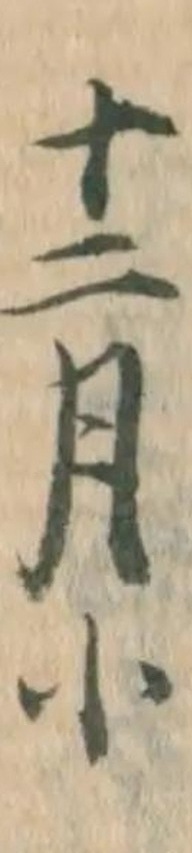十二月小
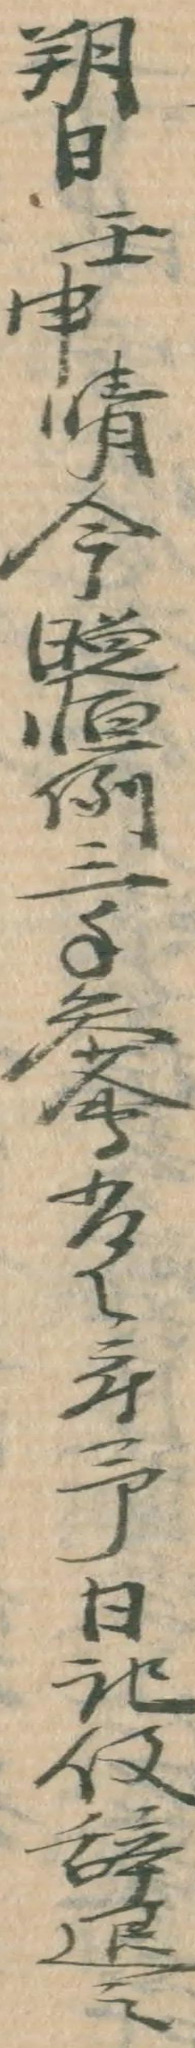朔日壬申晴今晩恒例三手参會有之ニ付予日記役辞退之
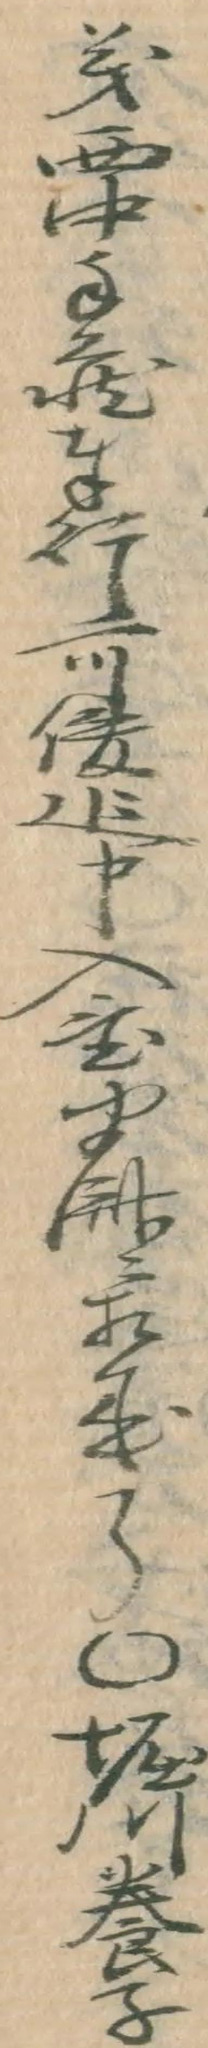義西中手蔵奉行可後迄申入置聞済ニ相成候○堀川養子

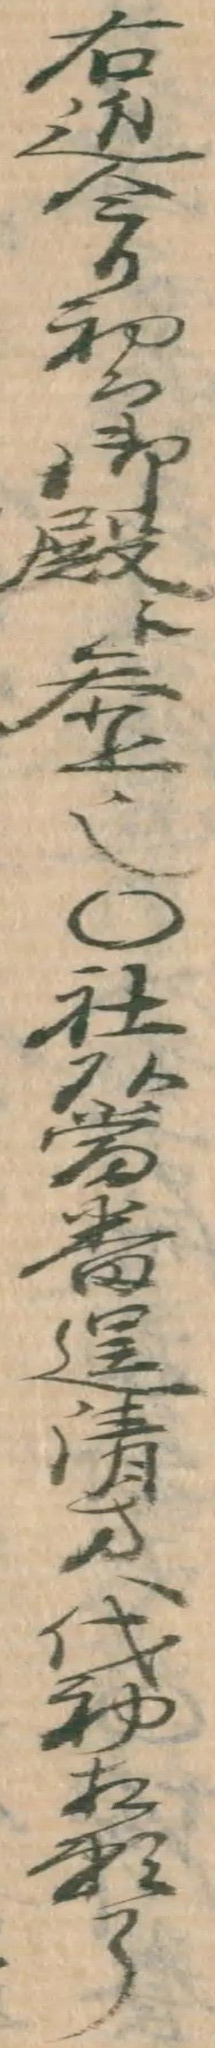右近今日初而御殿参上江参上也○社頭當番逞清方へ代勤相頼了
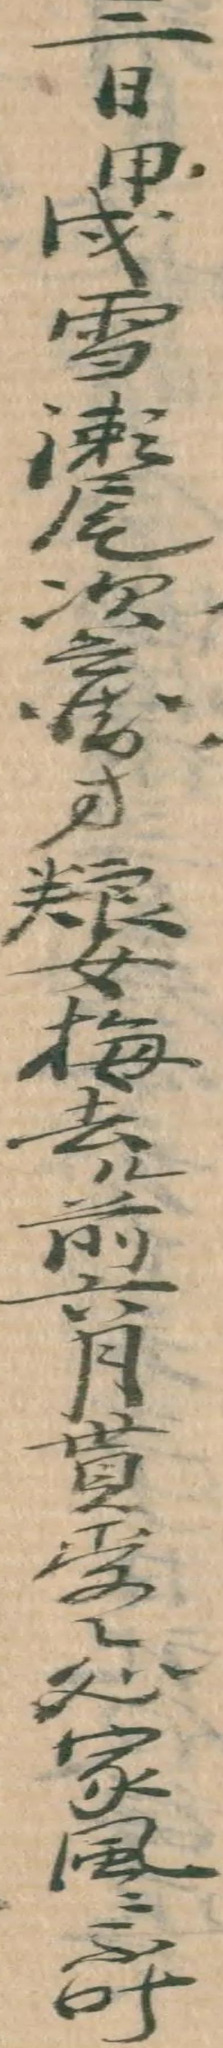三日甲戌雪瀬尾次兵衛方養女梅去ル前六月貰受候処家風ニ不叶
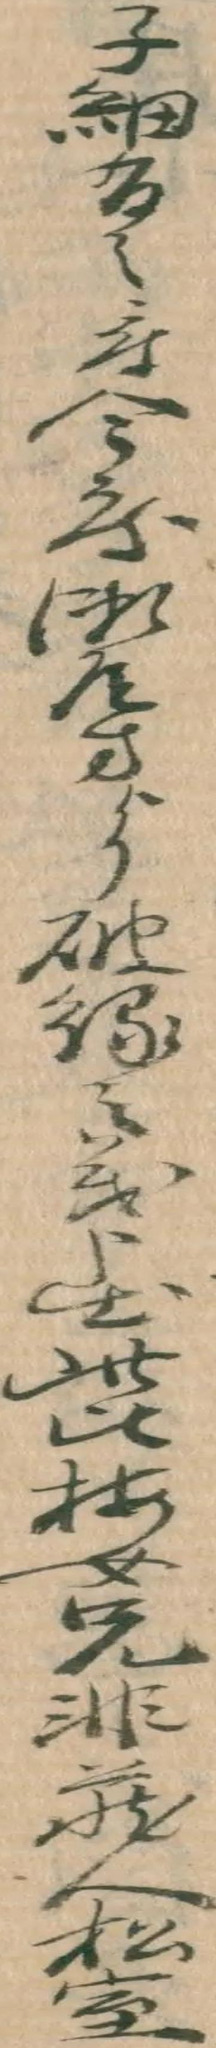子細有之ニ付今度瀬尾方より破縁之義申出此比梅女兄非蔵人松室
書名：賀茂社記録. 第65冊
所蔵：国立国会図書館 National Diet Library, JAPAN
